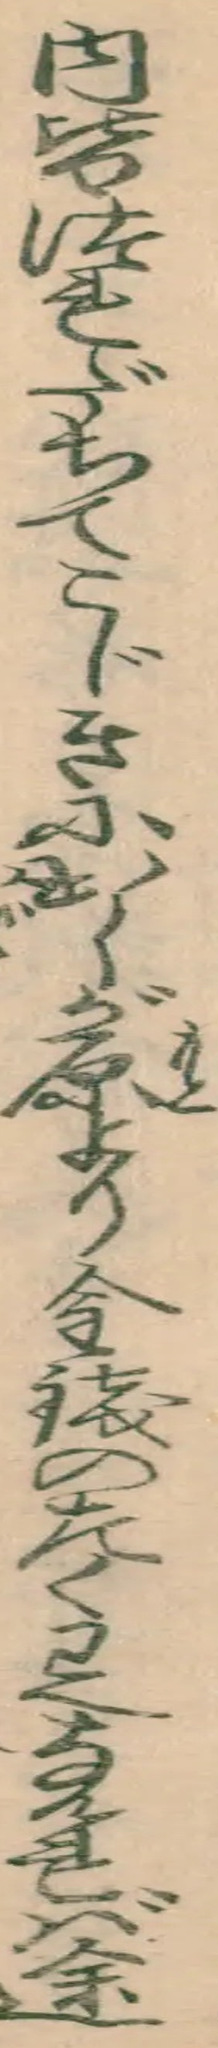内皆つれだちてこじきに出しが原より金銭のたくわへなければ途
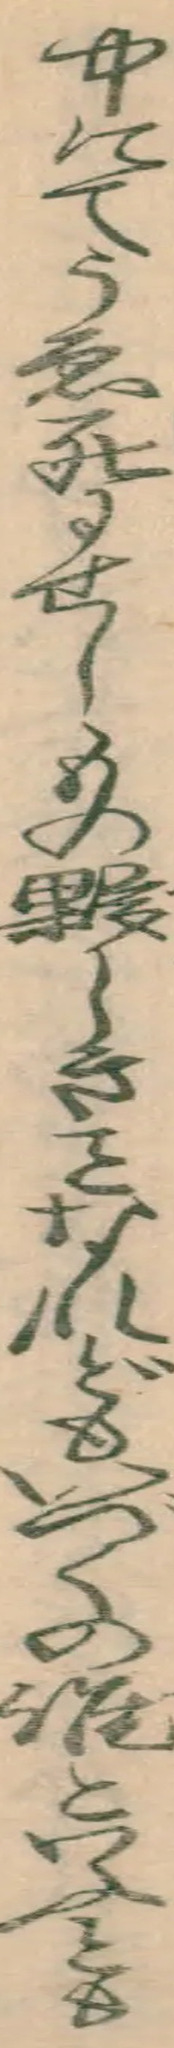中にてうゑ死にせしもの夥しきことなれどもいづくの誰といふとも
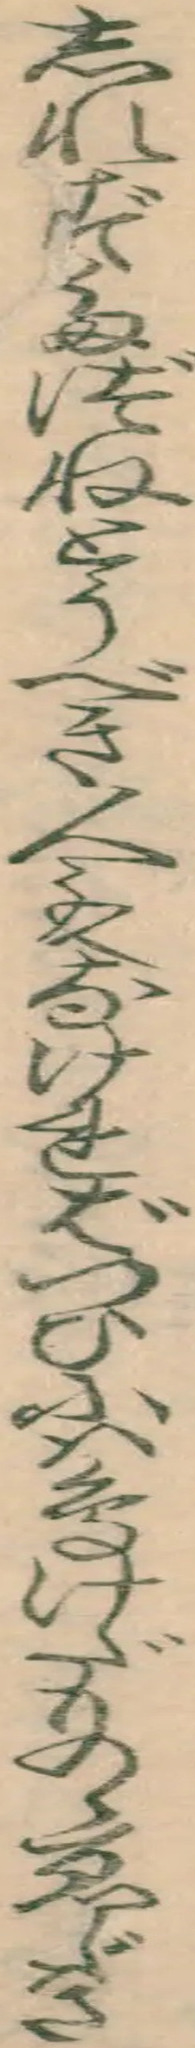しれずたづねとうべき人々もなければつひには鳥けだものゝゑじき
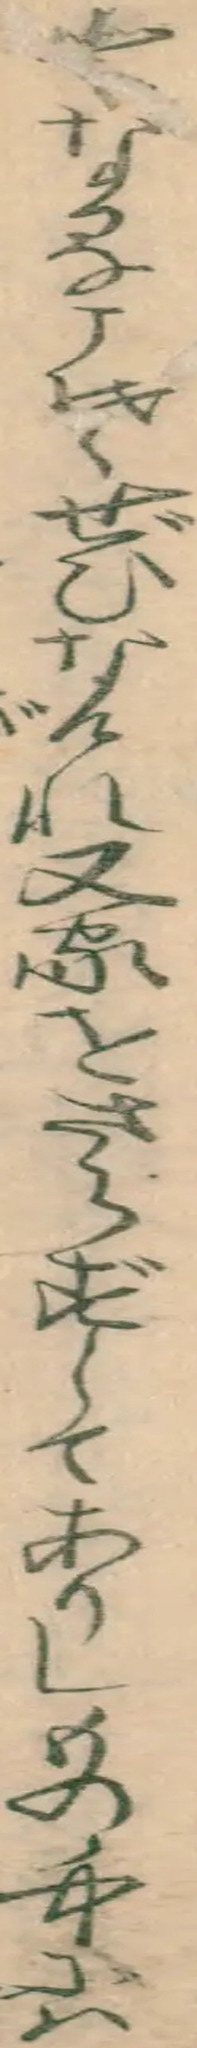となるこそぜひなけれ又家をさらずしてありしものゝ中は
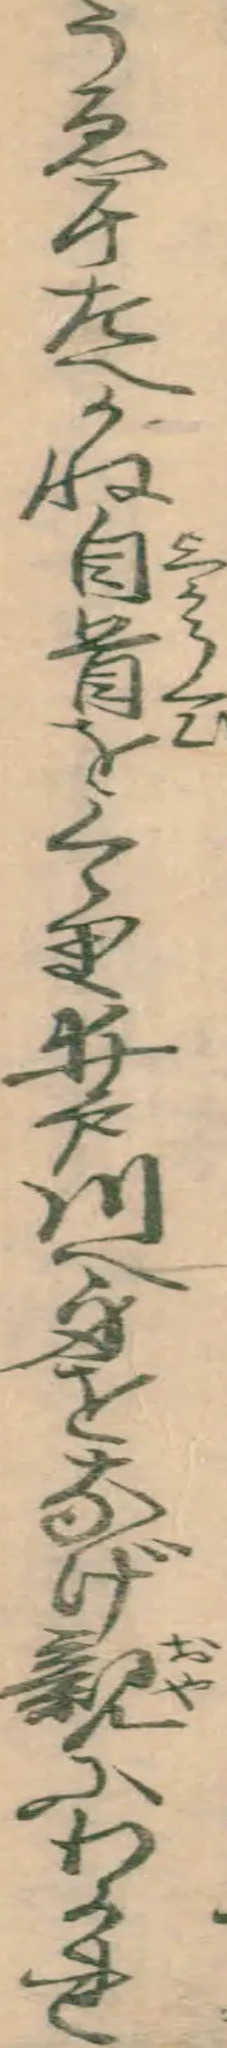うゑにたへかね自首をくゝり井戸川へ身をなげ親にわかれ

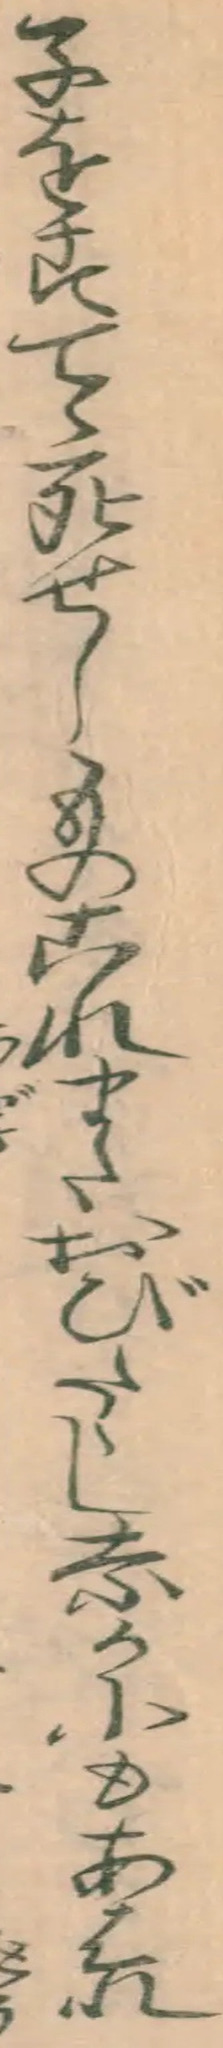子をすてゝ死せしものこれまたおびたゝしなかにもあはれ
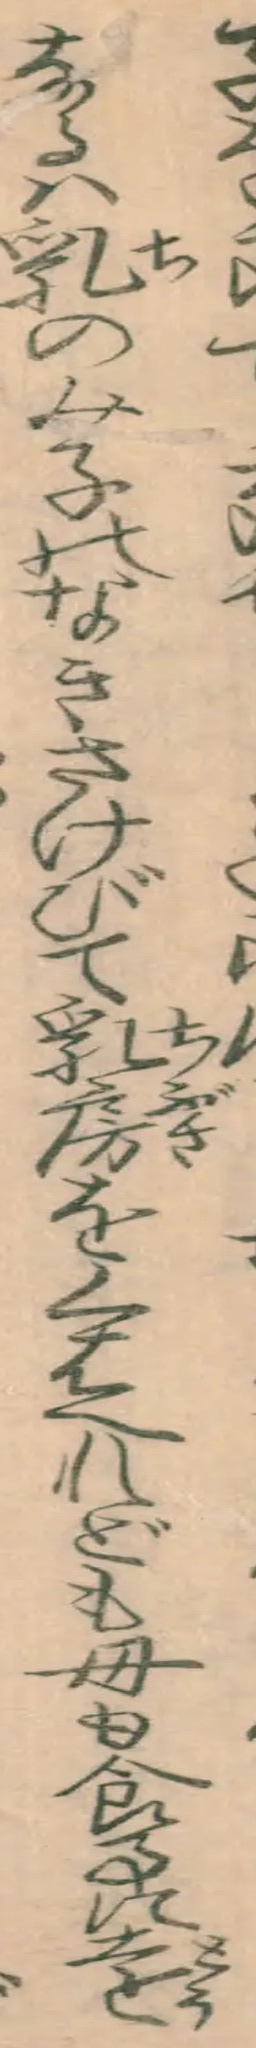なるは乳のみ子のなきさけびて乳房をくはへれども母も食事に遠
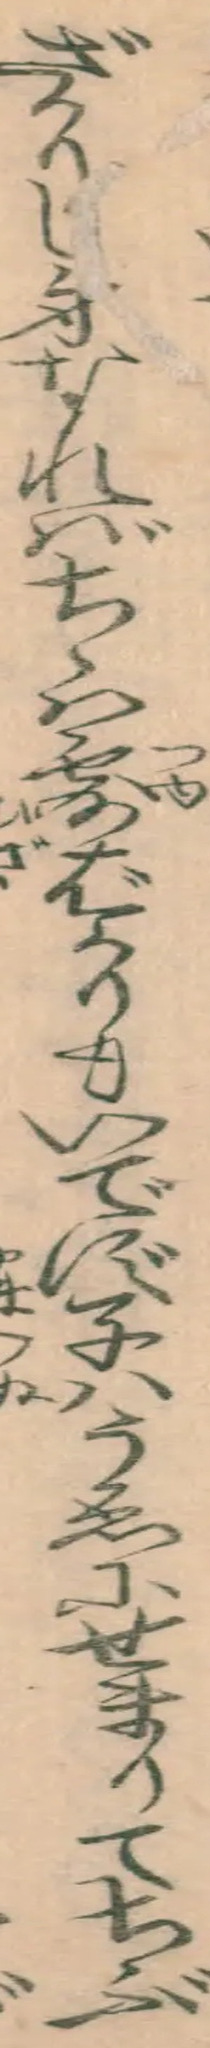ざかりし身なればちゝは露ばかりもいでず子はうゑにせまりてちぶ
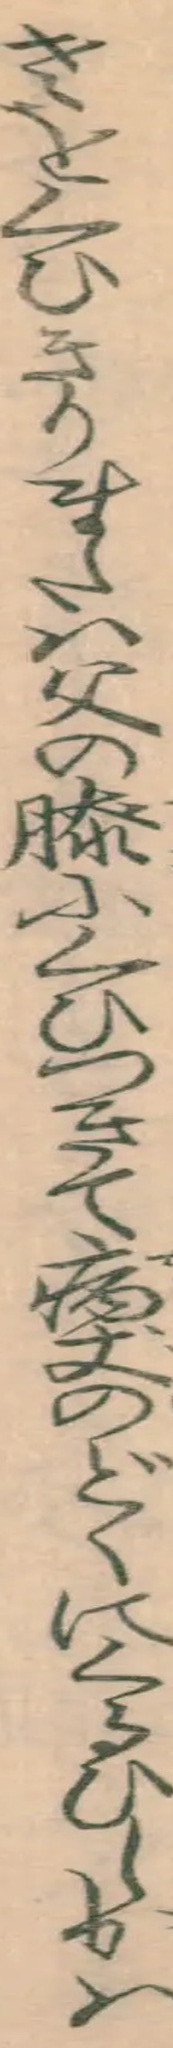さをくひきりまたは父の膝にくひつきて病犬のどくにくるひしかば
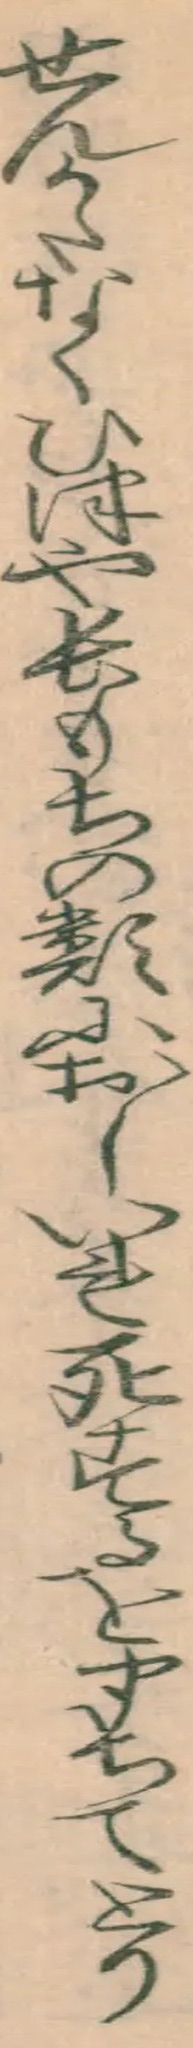せんかたなくひつや長もちの類におしいれ死するをまちてとり
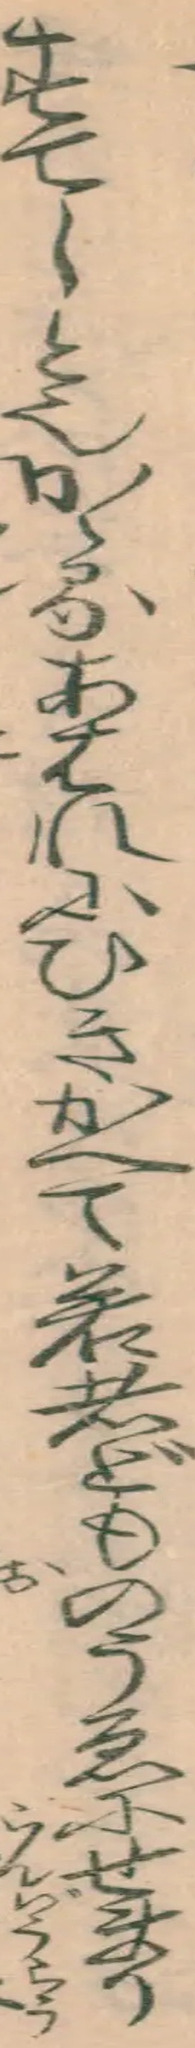すてしと也かゝるあはれにひきかへて若者どものうゑにせまり
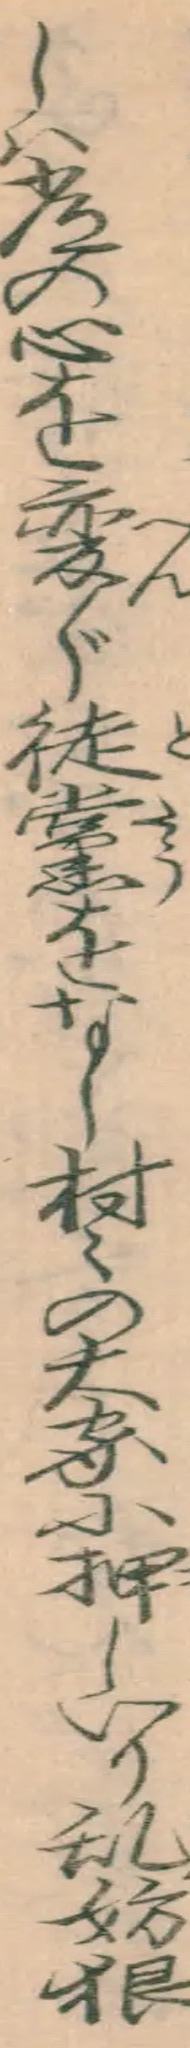しは常の心を変じ徒党をなし村々の大家に押しいり乱妨狼
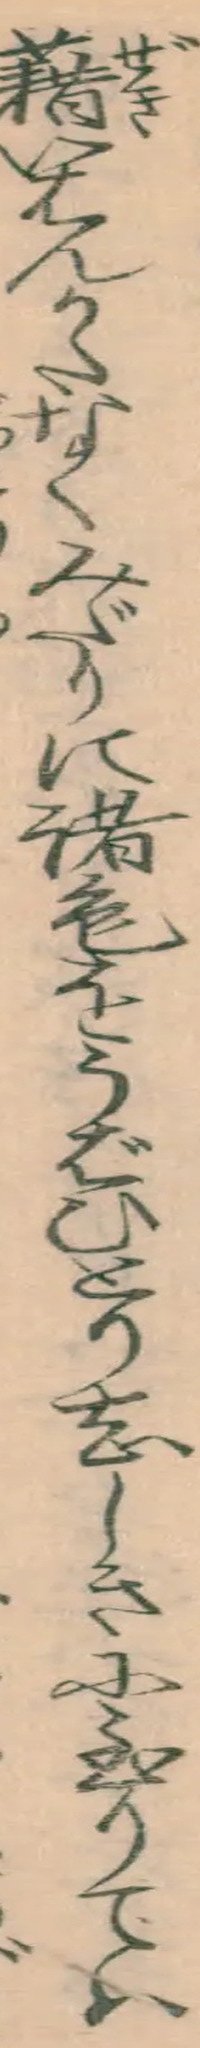藉いはんかたなくみだりに諸色をうばひとり甚しきに至りては
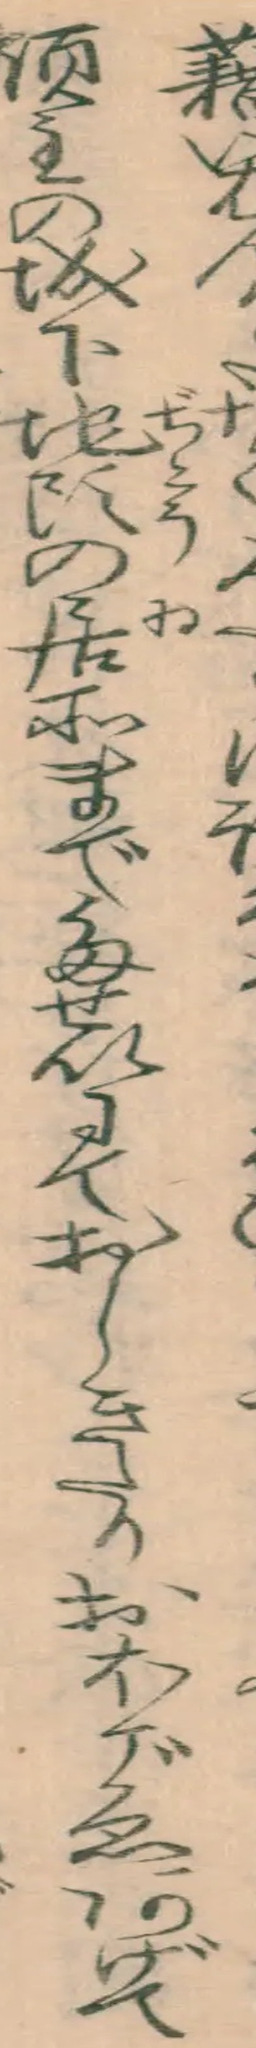領主の城下地頭の居所までたせいにておしきたりおほごゑあげて
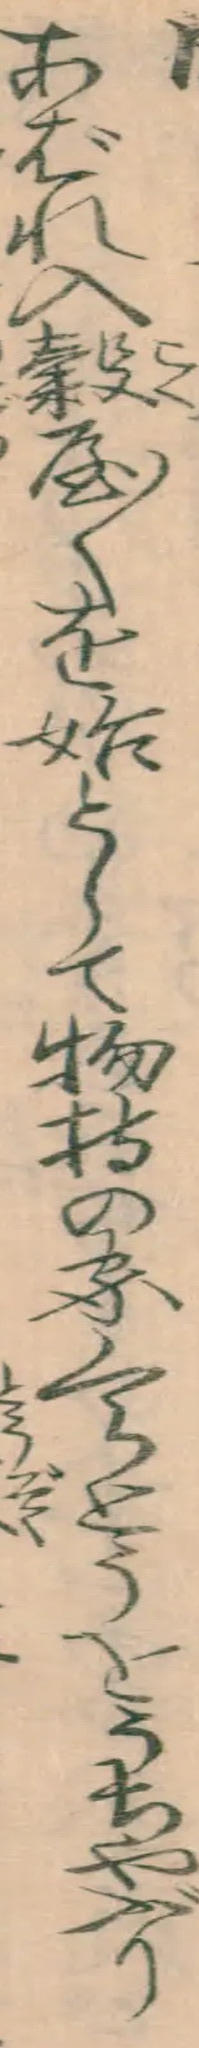あばれ入穀屋〳〵を始として物持の家くらとうをうちやぶり
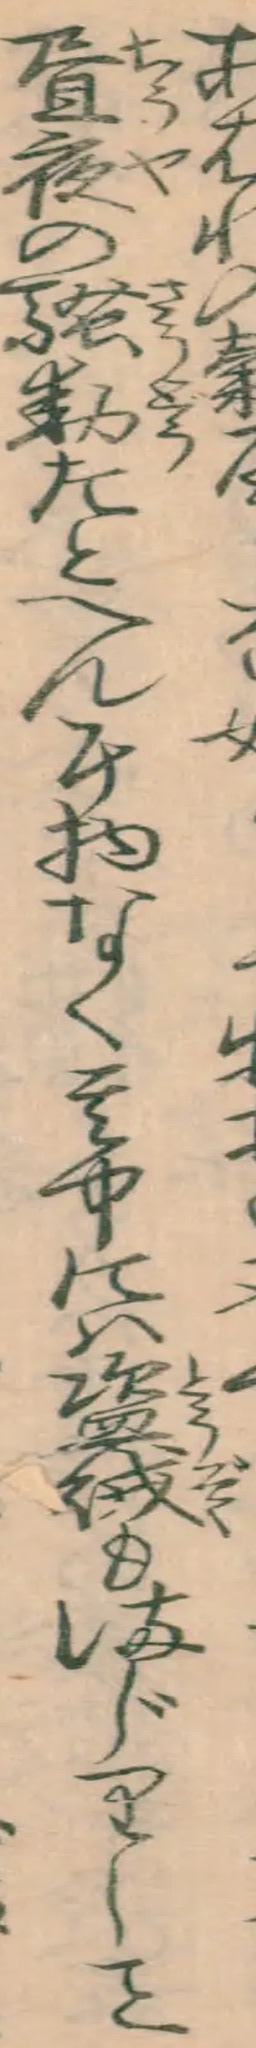昼夜の騒動たとへんに物なく其中には盗賊もまじりしこと
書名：日ごとの心得
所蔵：国立国会図書館 National Diet Library, JAPAN
